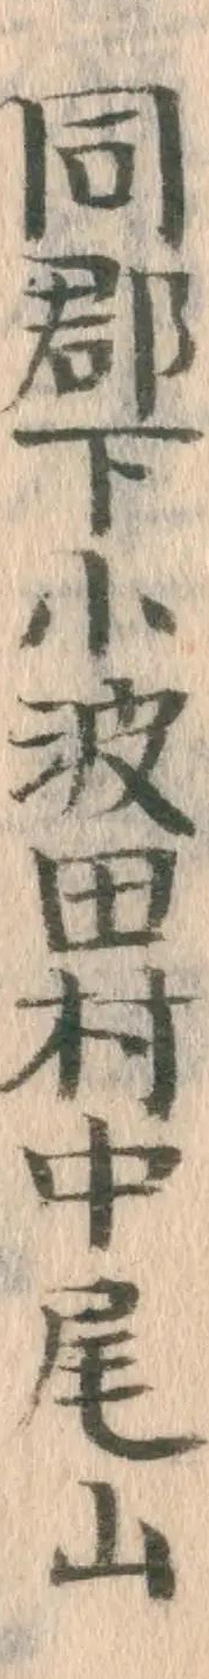同郡下小波田村中尾山
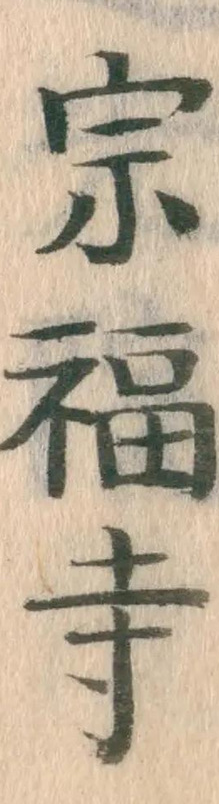宗福寺

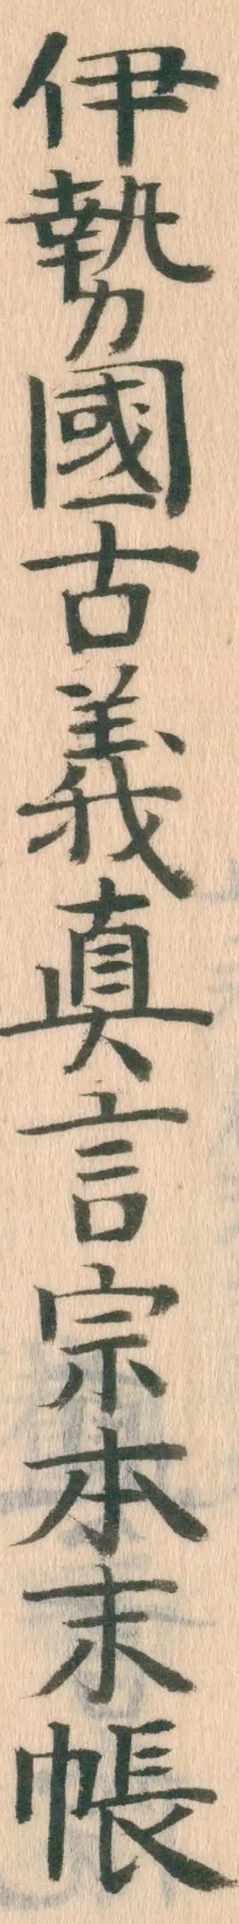伊勢国古義真言宗本末帳
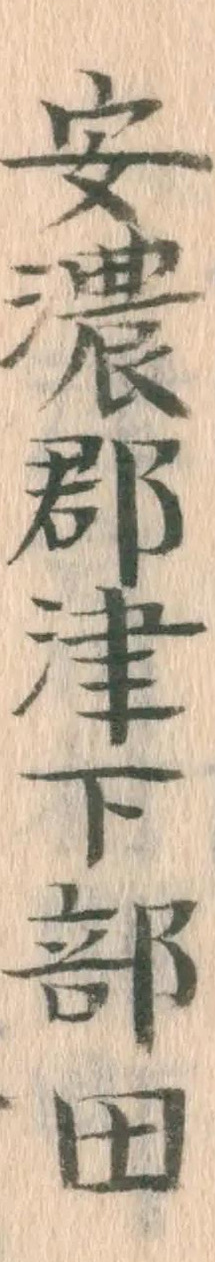安濃郡津下部田
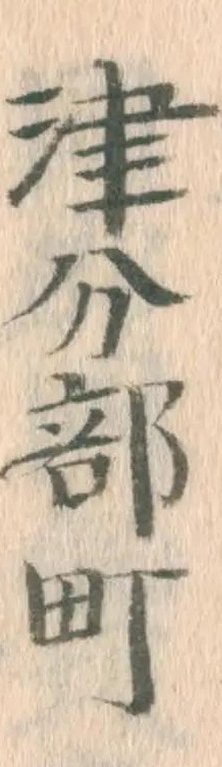津分部町
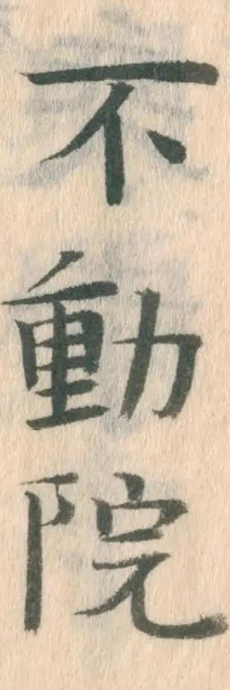不動院

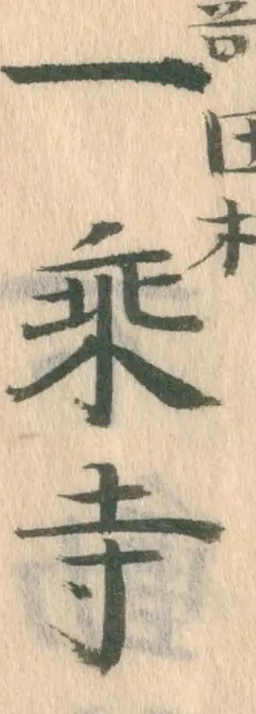一乗寺
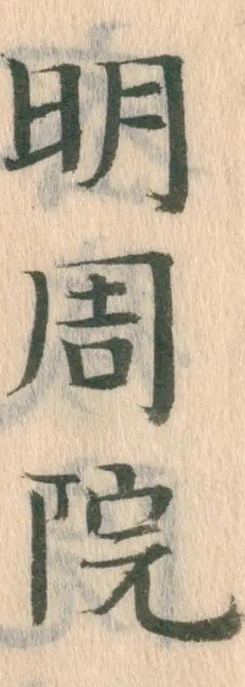明周院
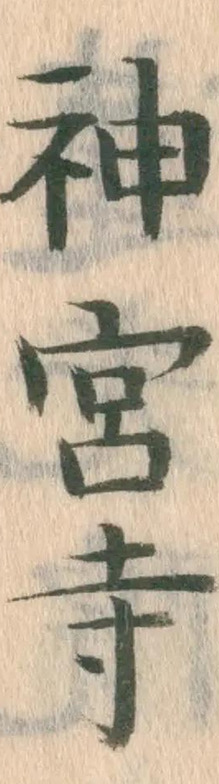神宮寺
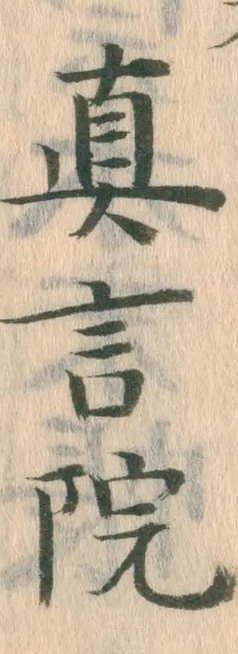真言院
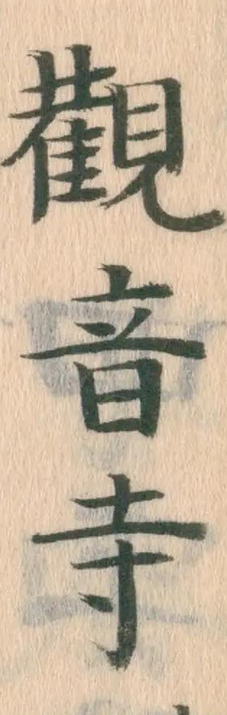観音寺
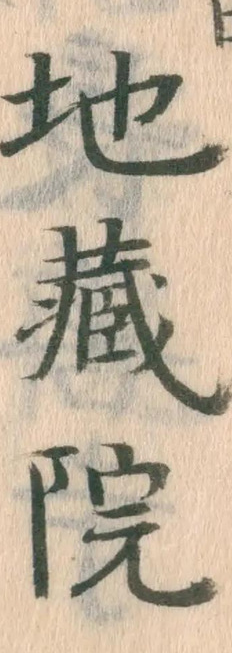地蔵院
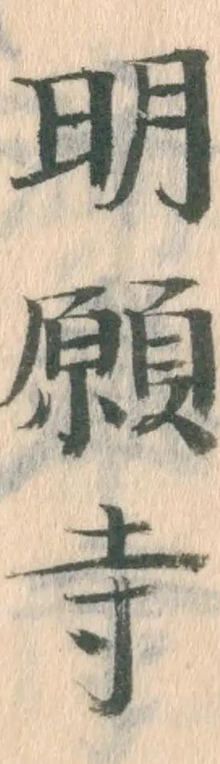明願寺

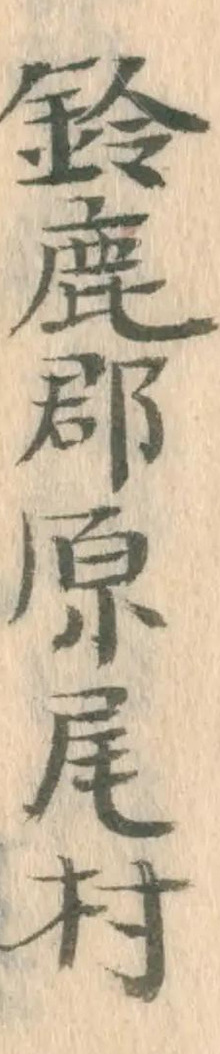鈴鹿郡原尾村
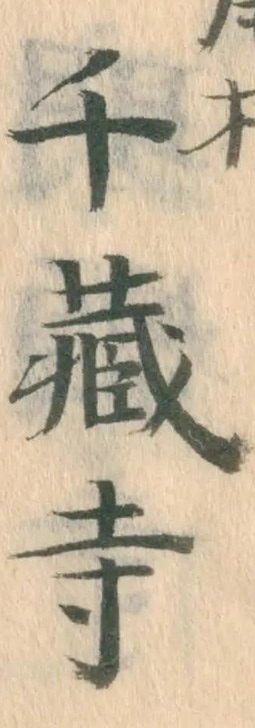千蔵寺
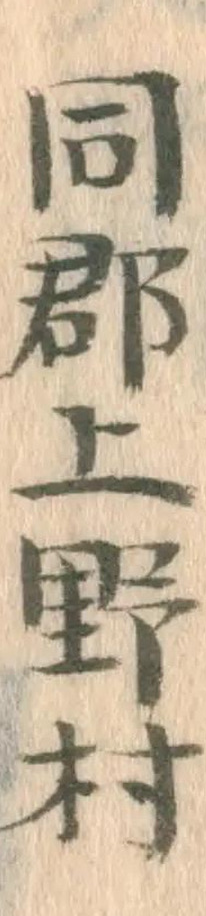同郡上野町
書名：古義真言宗本末帳 21巻. [4] 第三 伊賀国、伊勢国、志摩国、尾張国、三河国、遠江国、駿河国、伊豆国、甲斐国
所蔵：国立国会図書館 National Diet Library, JAPAN
